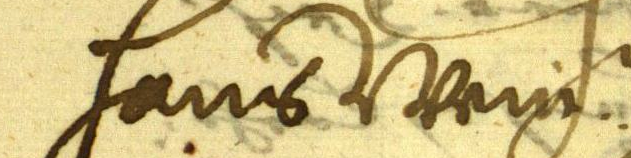Hans Wein¬
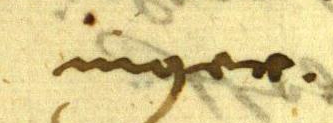inger.
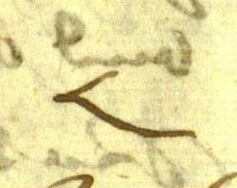t
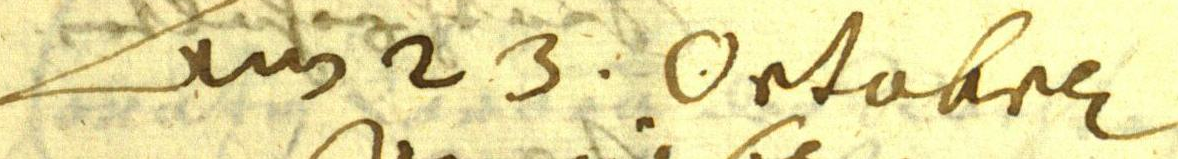Am 23. October
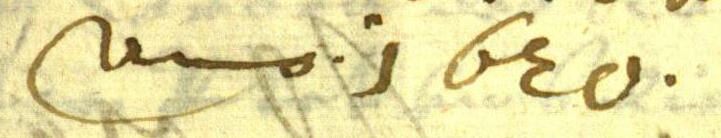Anno .1620.
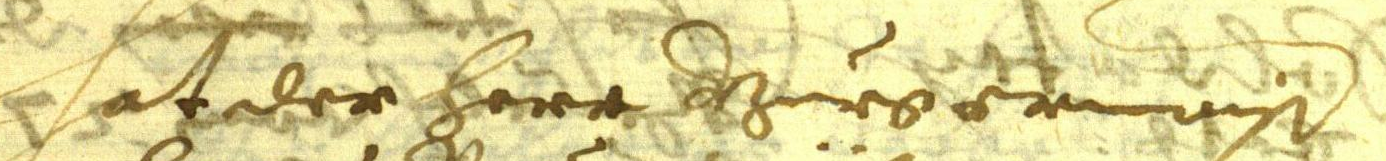hat der herr Būrgermaist
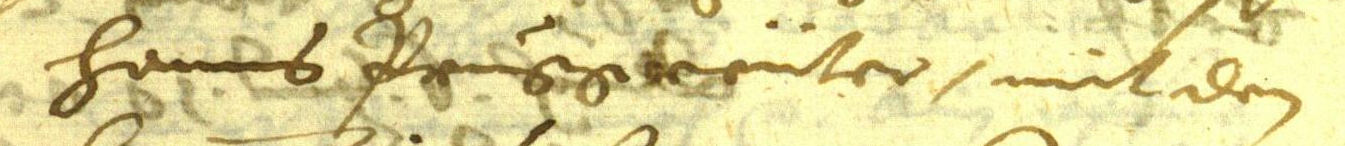hanns Prūggreüter, mit den
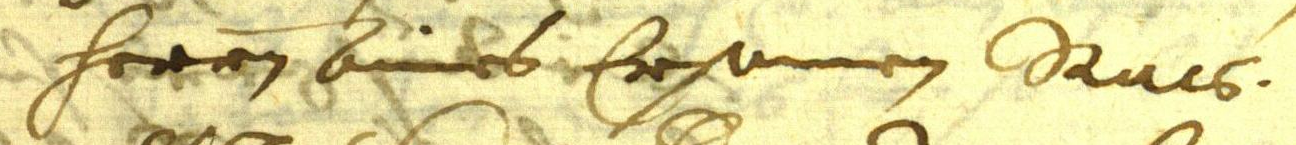herrn Aines Ersamen Rats.
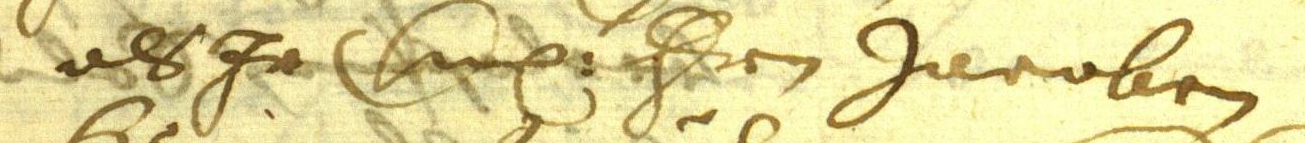als Ir Gn: hen Jacoben
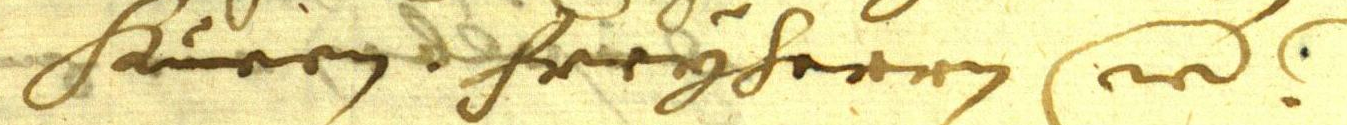Kūeen. freȳherrn etc.
